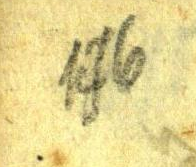176
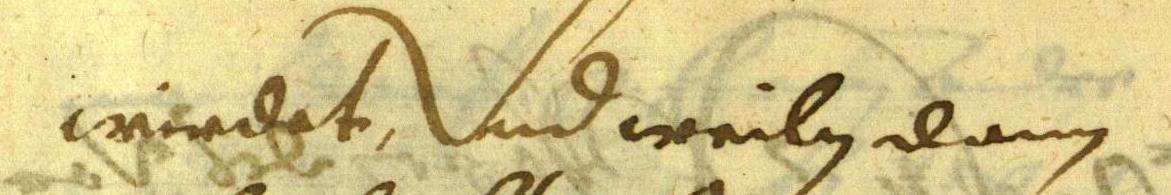wirdet, Vnd weiln dann
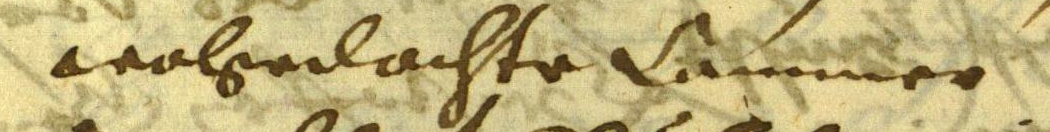wolgedachte Cammer
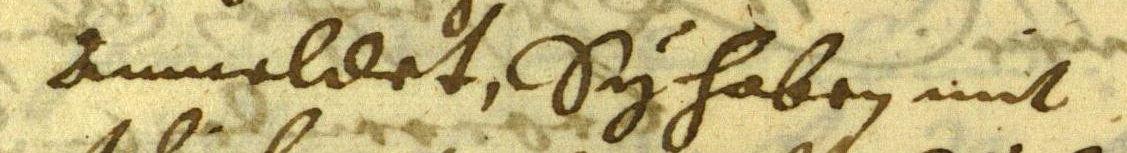Anmeldet, Sȳ haben mit
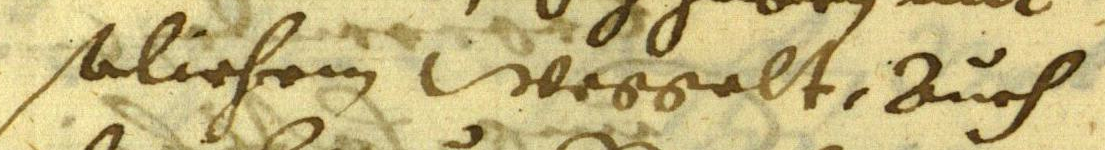solichem Weggelt, Aūch
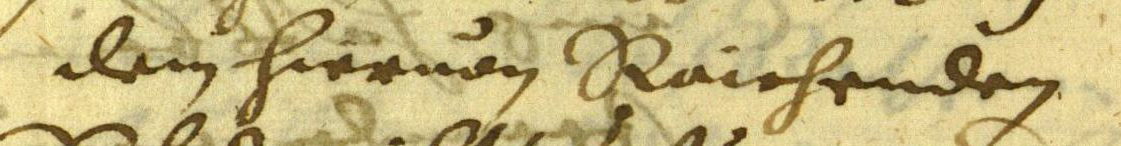dem hiervon Raichenden
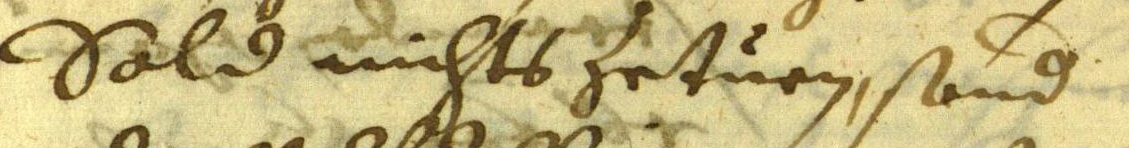Sold nichts Zetūen, sond
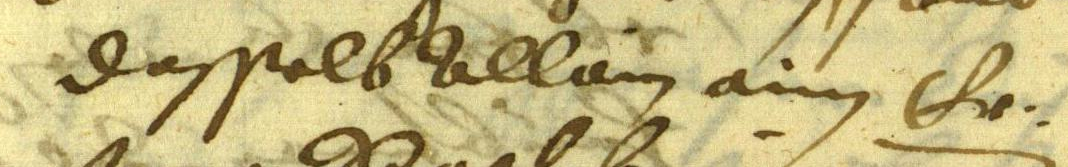dasselb Allain aim Er¬
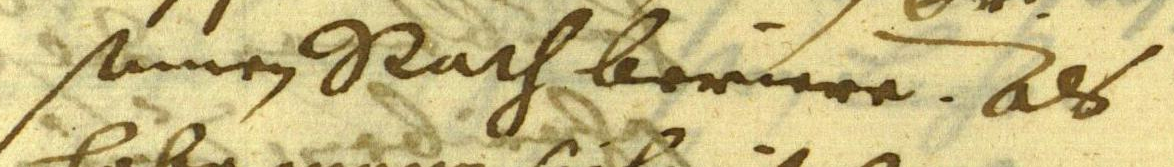samen Rath beriere. Als
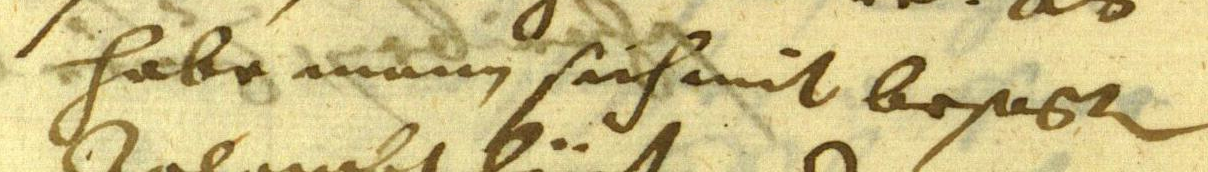habe mann sich mit besagt
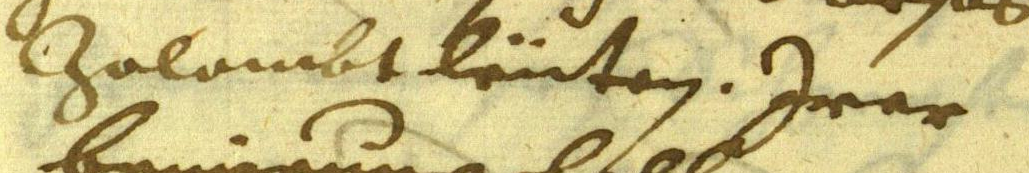Zolambtsleüten. Irer
